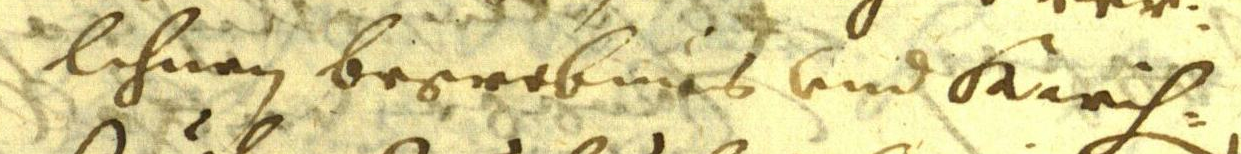lihnen begrebnūs vnd Kirch¬
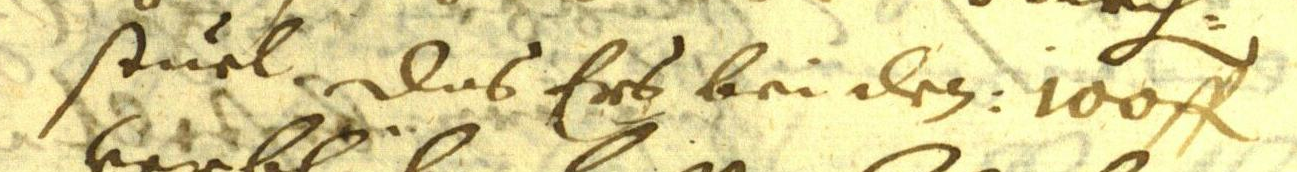stūel. das Ers bei den: 100 fl
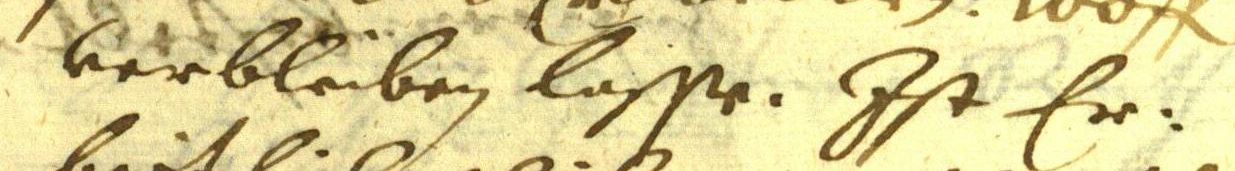verbleiben lasse. Ist Er¬
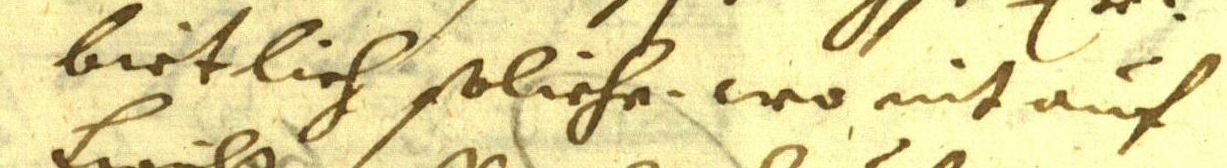bietlich soliche. wo nit aūf
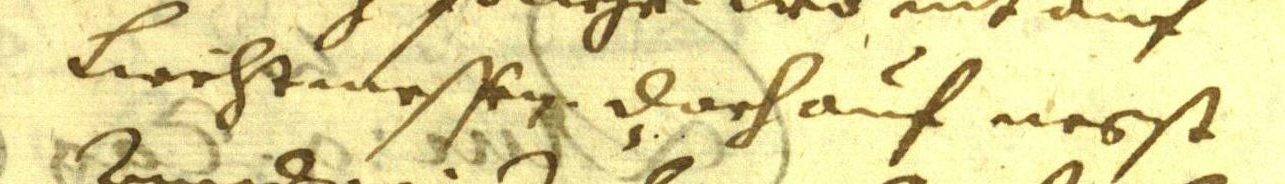Liechtmessen. doch aūf negst
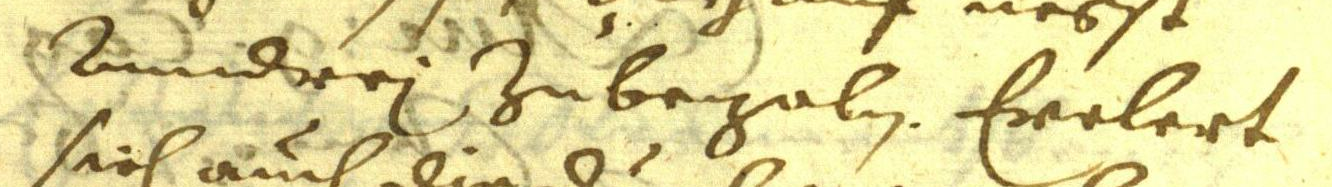Anndrej Zū bezaln. Erclert
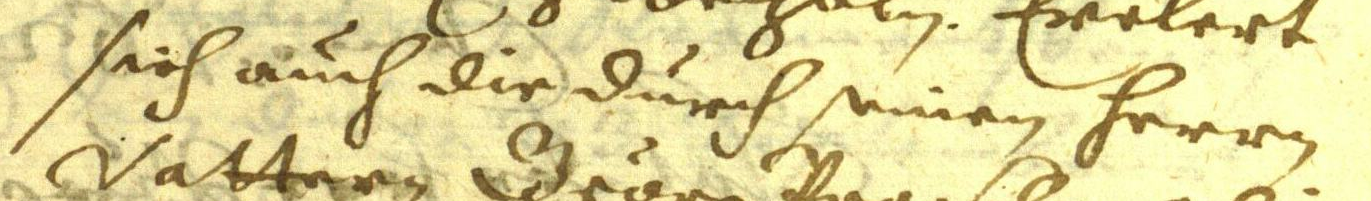sich aūch die dūrch seinen herrn
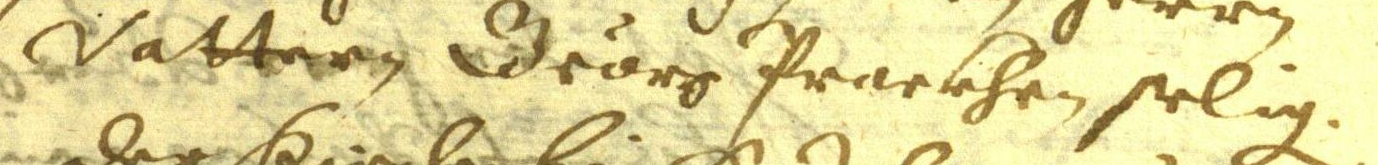Vattern Geōrg Prackhen selig
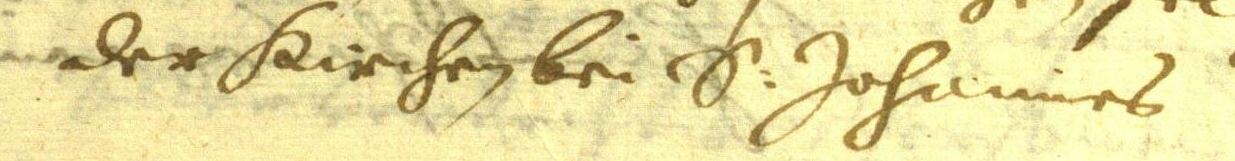der Kirchen bei S: Johannes
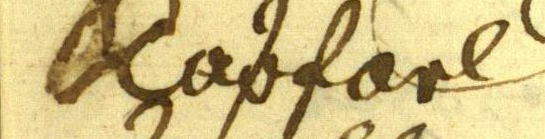Rapfael
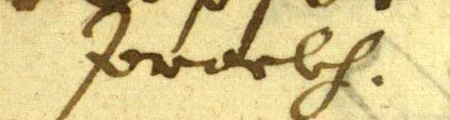Prackh.
